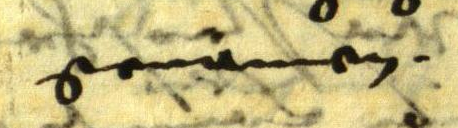genomen.
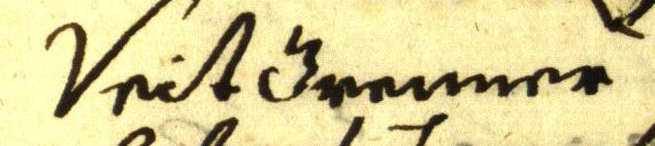Veit Grenner
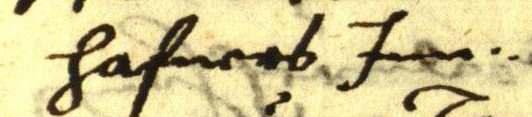hafners Inn¬
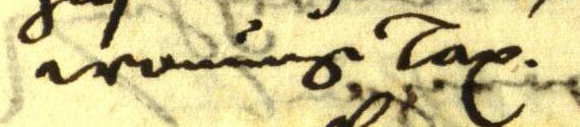wonūng Tax.
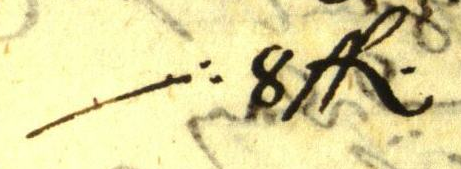—: 8 fl.
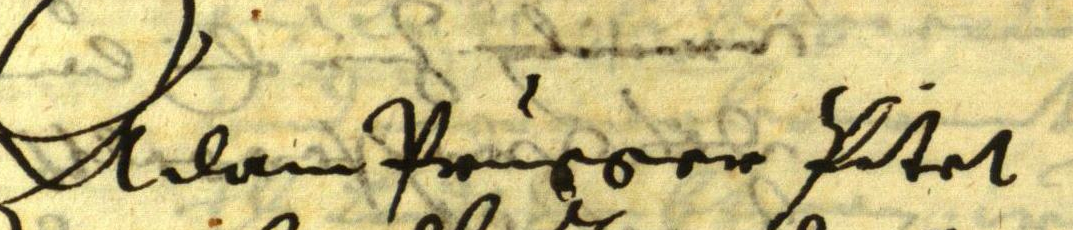Adam Prūgger Pitet
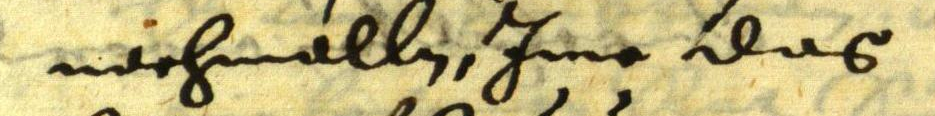nochmalln, Ime das
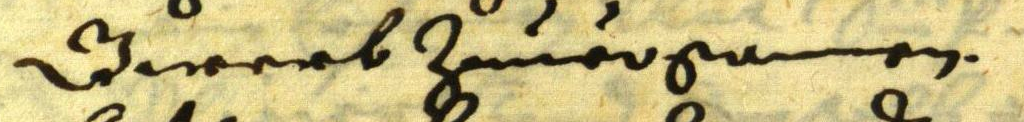Gwerb Zūūergonnen.
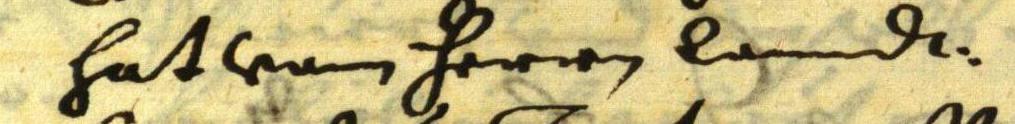hat vom herrn Lanndt¬
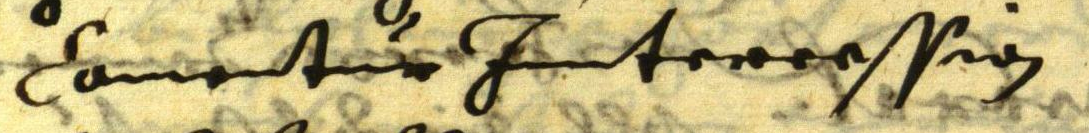Comentūr Inntercession
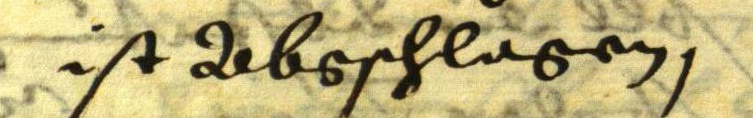ist Abgschlagen,
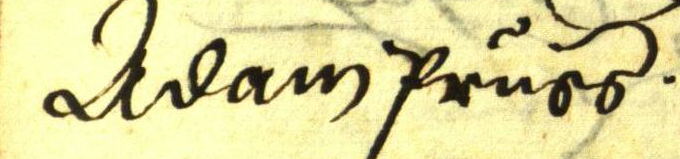Adam Prūgg.
